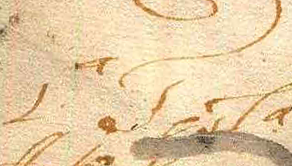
1.a Testa.
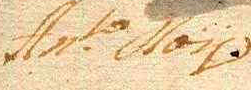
An.to Rois
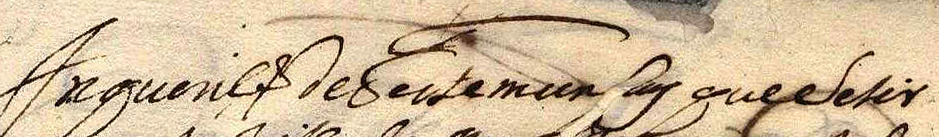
Jnqueriçaõ de Testemunhas que se tir
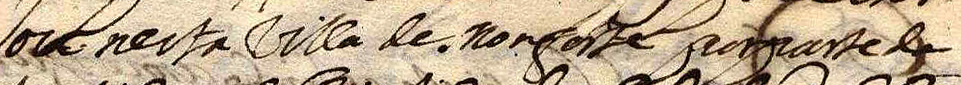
ou nesta Villa de Monforte por parte da
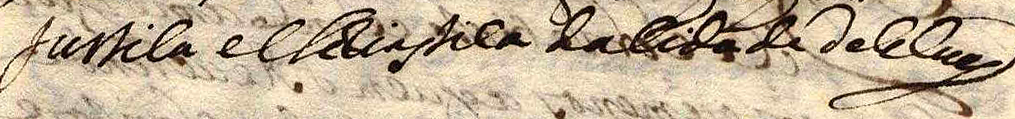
Justiça ecleziastica da Cidade de Eluas
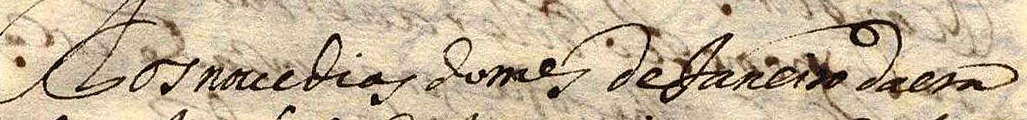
Aos noue dias do mes de Janeiro da era
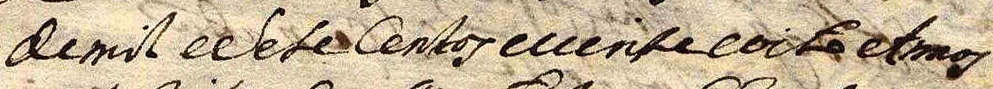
de mil e setecentos e uinte e oito Annos
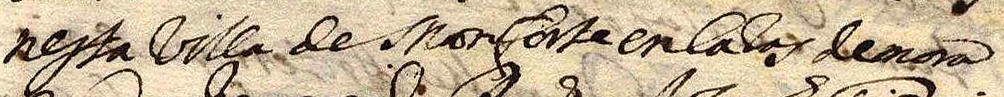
nesta Villa de Monforte en cazas de mora
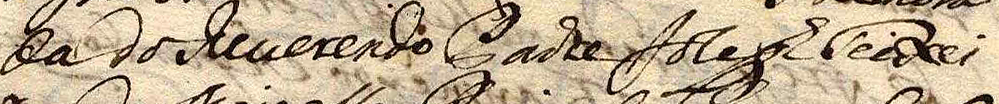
da do Reuerendo Padre Jozeph Teixei
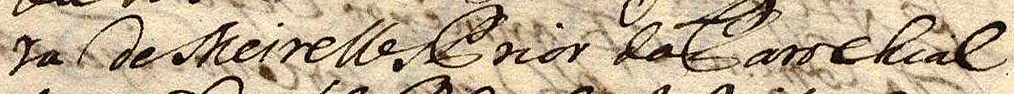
ra de Meirelles Prior da Parochial
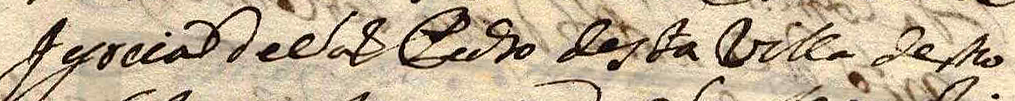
Jgreia de Saõ Pedro desta Villa de Mo
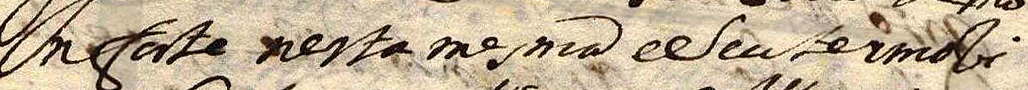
nforte nesta mesma e Seu termo Vi
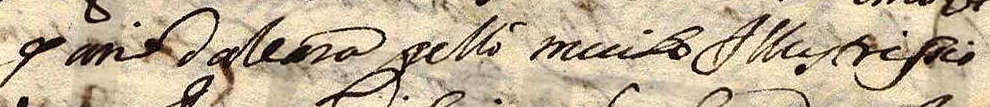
gario da Vara pello muito Illustrissio
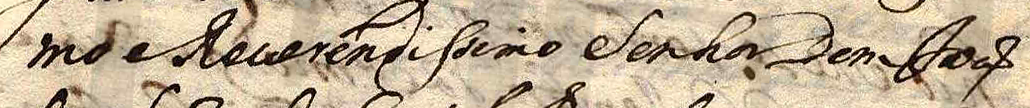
mo e Reuerendissimo Senhor Dom Joaõ
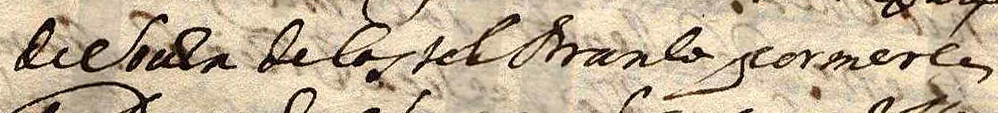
de Souza de Castel Branco por merce
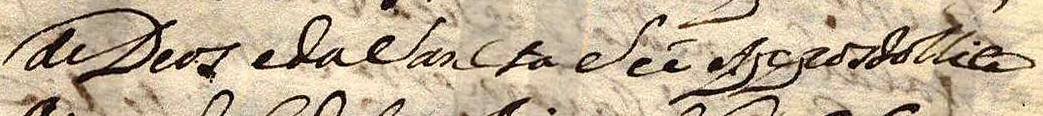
de Deos e da Sancta Seé Appostollica
